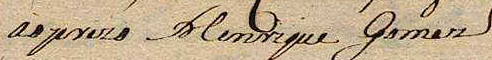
ao prezo Henrique Gomez
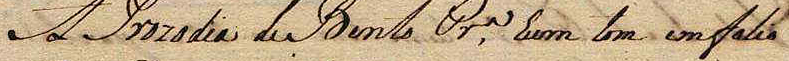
A Prozodia de Bento Pra. hum tom em folio
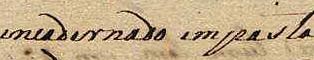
encadernado em pasta
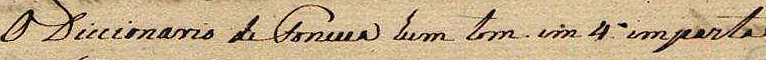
O Diccionario de Fonceca hum tom em 4 em pazta.
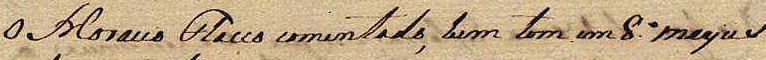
O Horacio Flacco comentado, hum tom em 8o. mayus
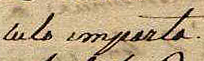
culo em pazta
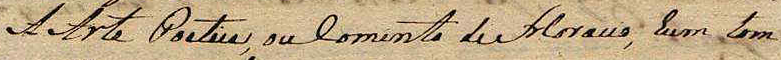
A Arte Poetica, ou Comento de Horacio, hum tom
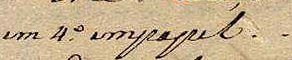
em 4o. em papel.
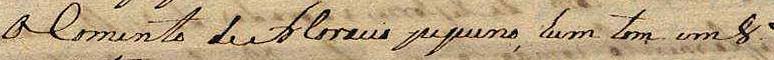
O Comento de Horacio pequeno, hum tom em 8o.
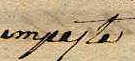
em pasta
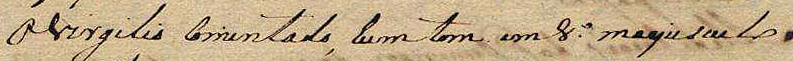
O Virgilio Comentado, hum tom com 8o. mayusculo
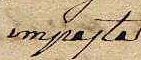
em pasta
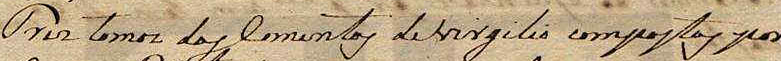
Trez tomoz dos Comentos de Virgilio compostos por
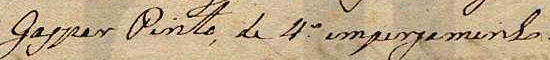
Gaspar Pinto, de 4o. em pergaminho.
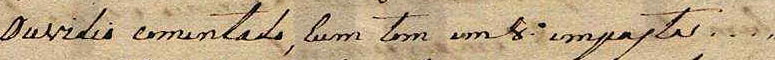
Ouvidio comentado, hum tom em 8o. em pasta
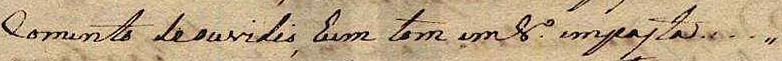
Comento de ouvidio, hum tom em 8o. em pasta
